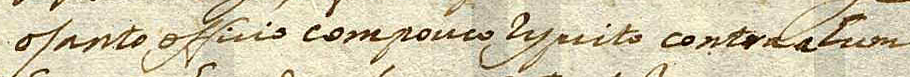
o santo officio com pouco Respeito contra a hum
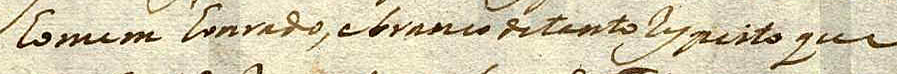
homem honrado, e branco de tanto Respeito que
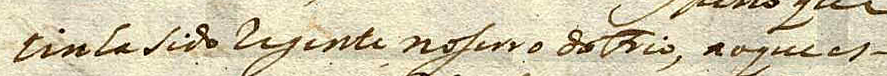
tinha sido Regente no serro do Frio, ao que es
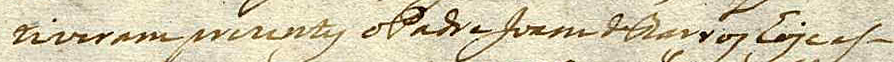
tiveram prezentes o Padre Joam de Barros hoje as
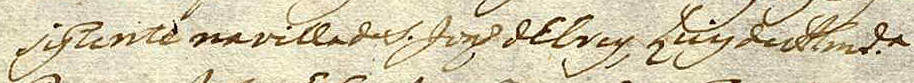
sistente na villa de S. Joaõ dEl rey, Luis de Almd.a
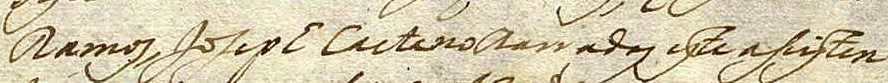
Ramos, Jozeph Caetano Barrados este assisten
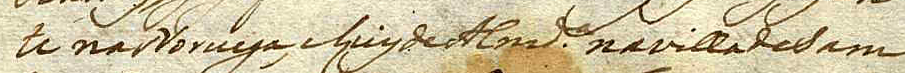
te na Noruega, e Luis de Almd.a na villa de Sam
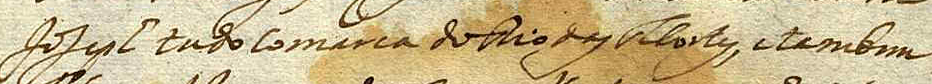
Jozeph tudo comarca do Rio das Mortes, e tambem
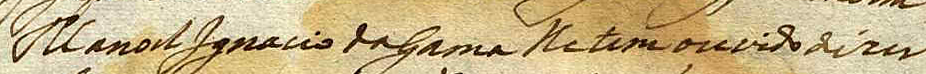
Manoel Jgnacio da Gama lhe tem ouvido dizer
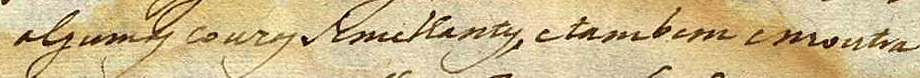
algumas couzas semelhantes, e tambem em outra
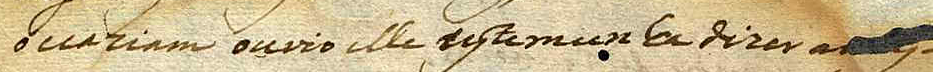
occaziam ouvio elle testemunha dizer a _es
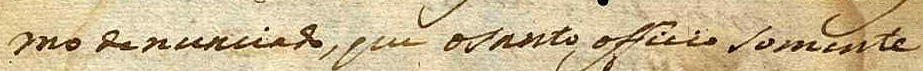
mo denunciado, que o santo officio somente
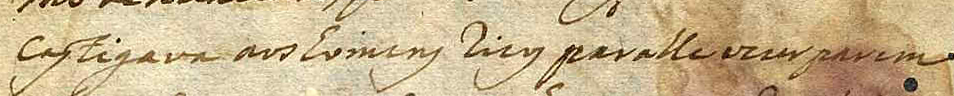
castigava aos homens Ricos para lhe uzurparem
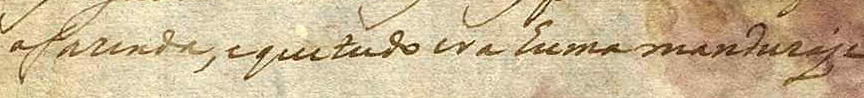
a fazenda, e que tudo era huma manduzaje
